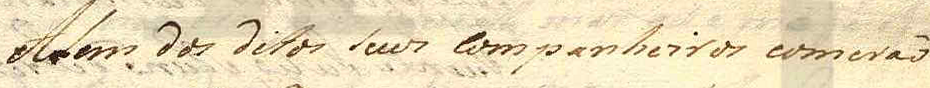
Alem dos ditos seus companheiros comeraõ
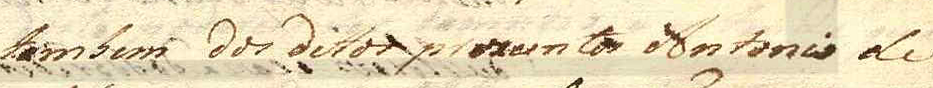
tambem dos ditos prezuntos Antonio de
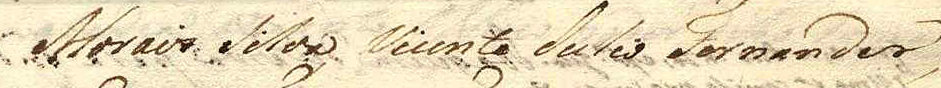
Morais Silva Vicente Iulio Fernandes
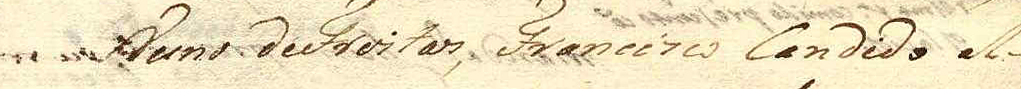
Nuno de Freitas, Francisco Candido al
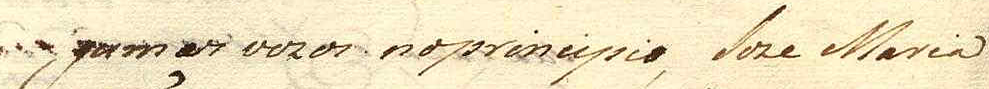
gumas vezes no principio, Ioze Maria
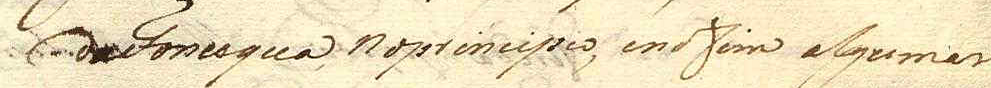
da Fonesqua, no principio e no fim algumas
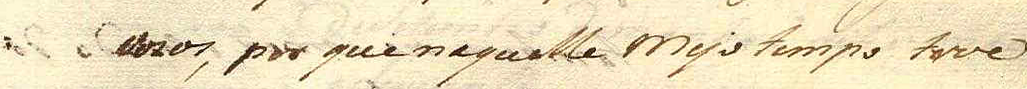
vezes, porque naquelle mejo tempo teve
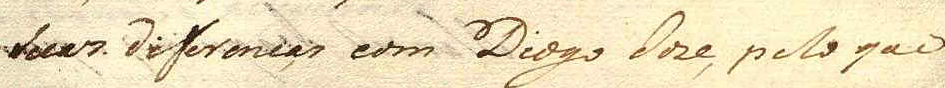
suas diferenças com Diogo Ioze, pelo que
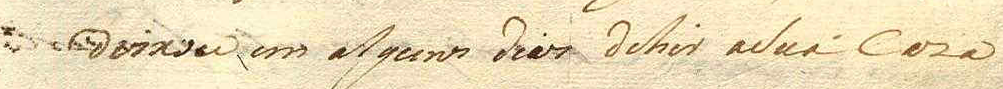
deixou em alguns dias de hir a Sua Caza
